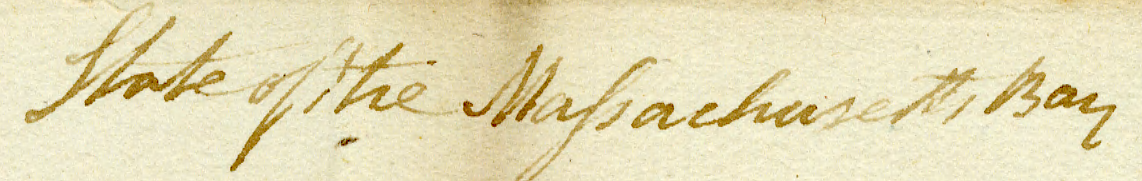State of the Massachusetts Bay
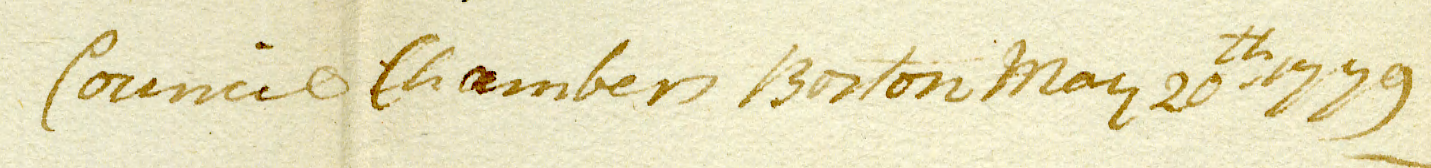Council Chambers Boston May 20^th 1779
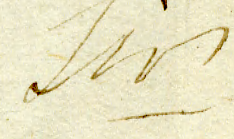Sir
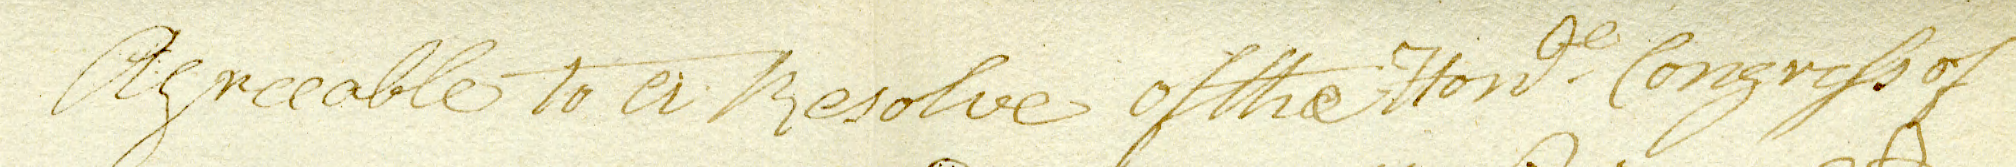Agreeable to a Resolve of the Hon^be. Congress of
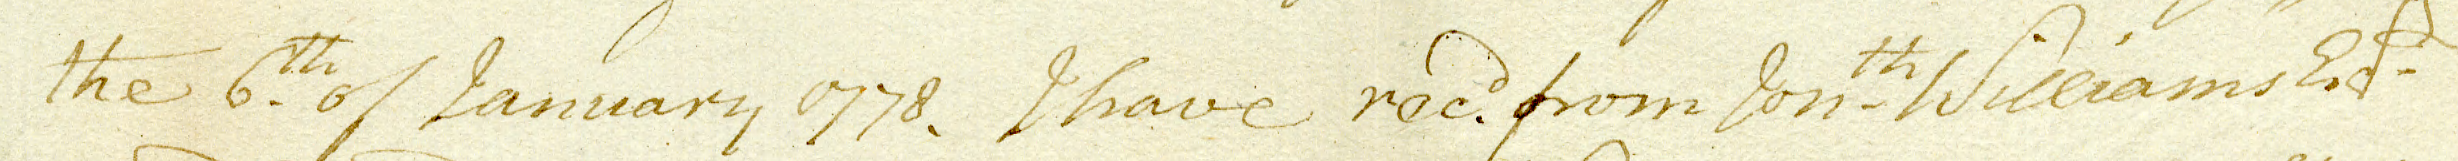the 6^th. of January 1778. I have rec^d. from Jon^th. Williams Es^r.
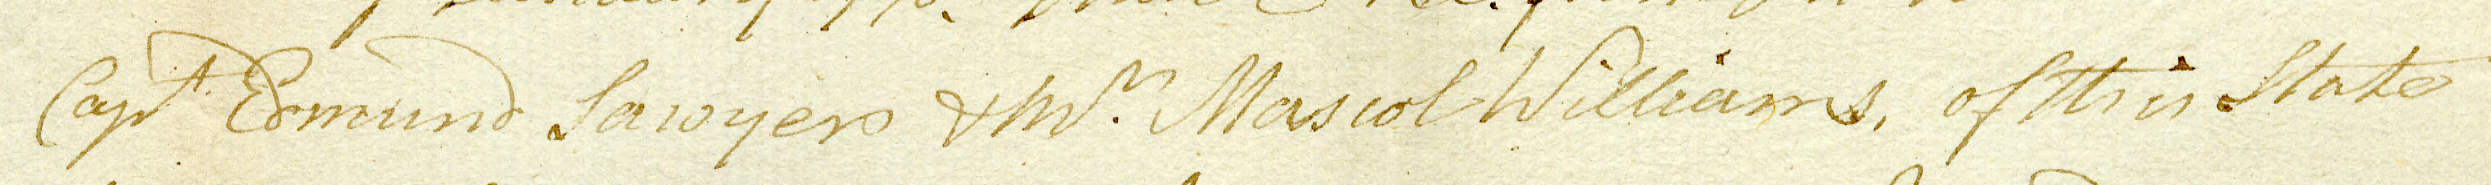Cap^t. Edmund Sawyers & M^r. Mascol Williams, of this State
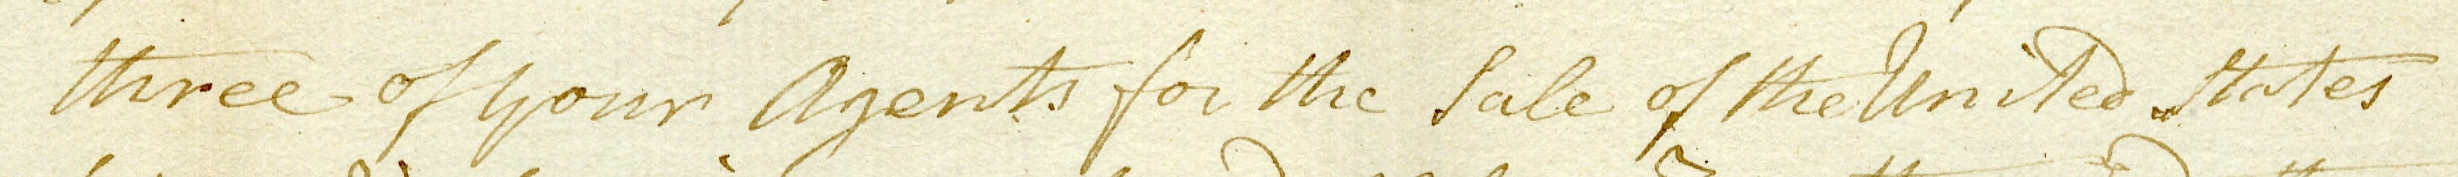three of your agents for the sale of the United States
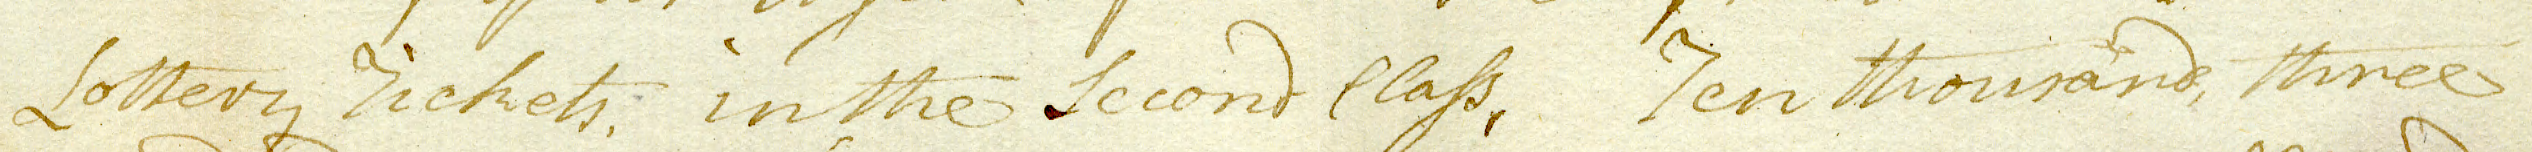Lottery Tickets in the Second Class, Ten thousand, three
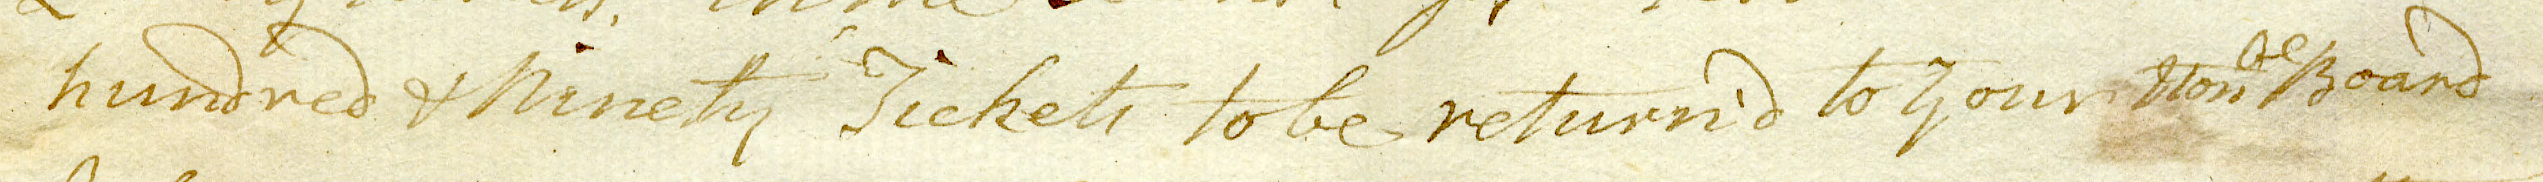hundred & ninety Tickets to be returned to your Hon^be Board
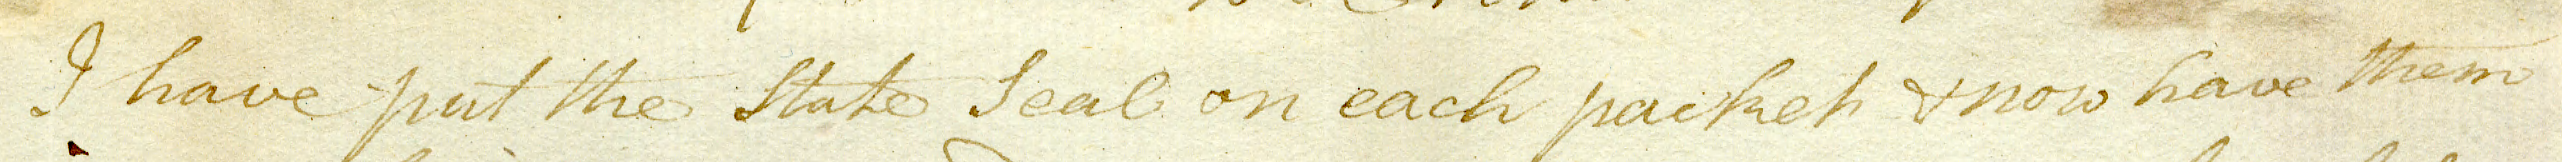I have put the State Seal on each packet & now have them
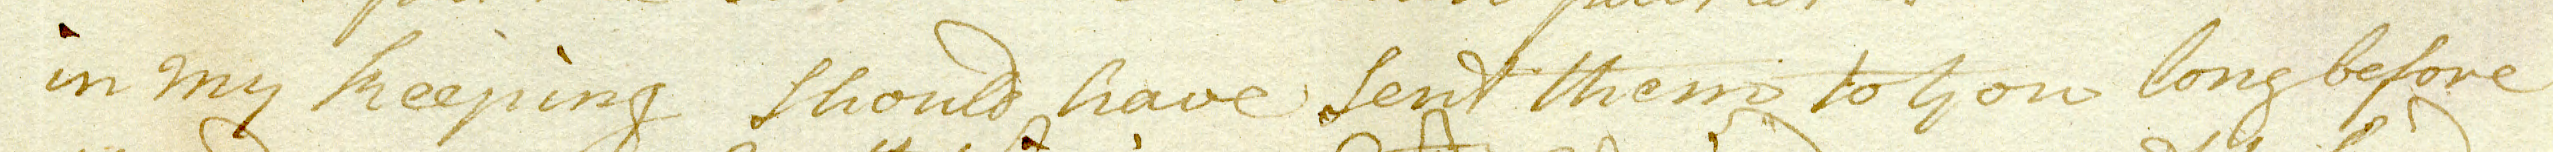in my keeping should have lent them to you long before
